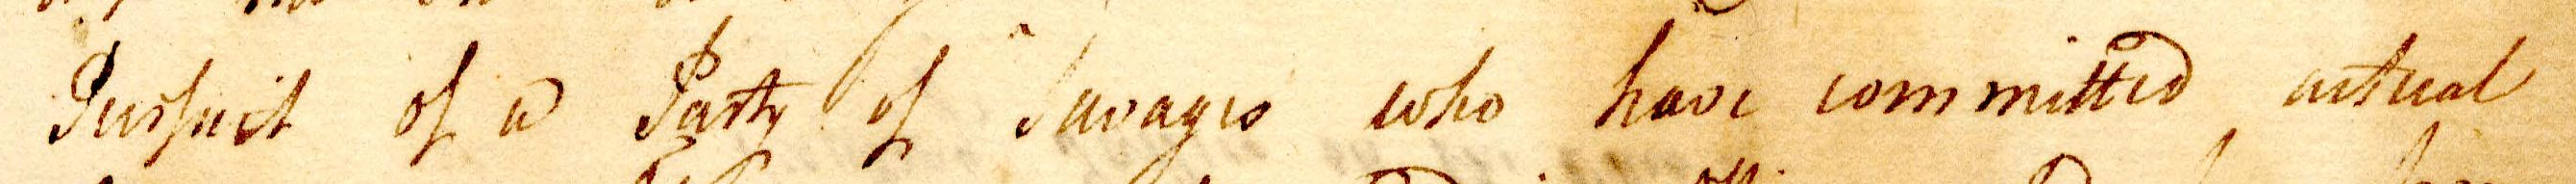Pursuit of a Party of Savages who have committed actual
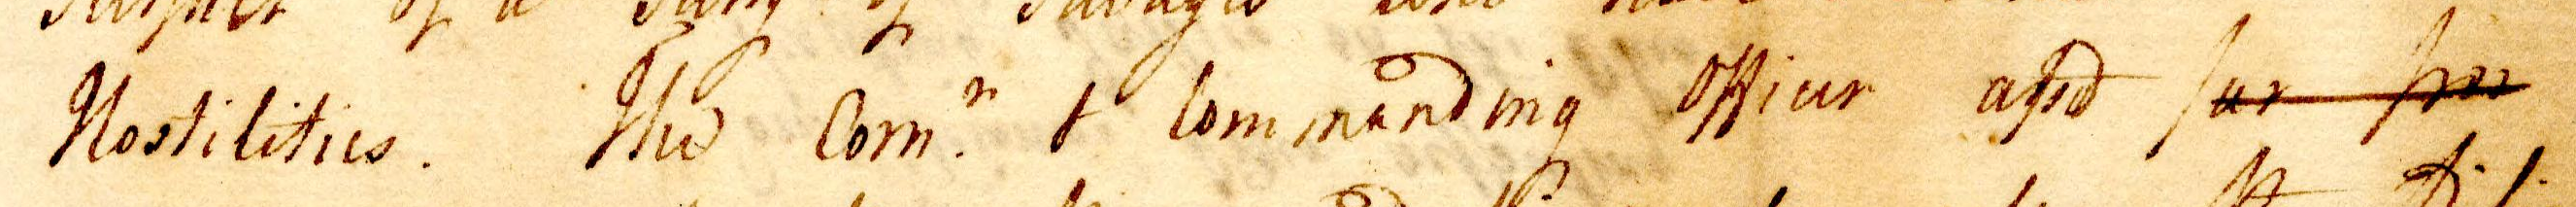Hostilities. The Com^r. & Commanding Officer asked [for] [__]
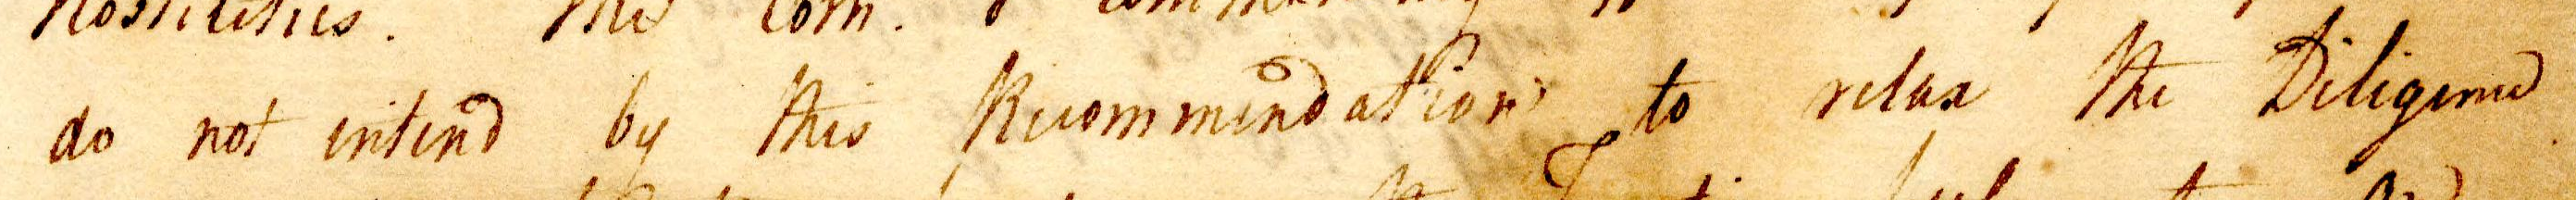do not intend by this Recommendation to relax the Diligence
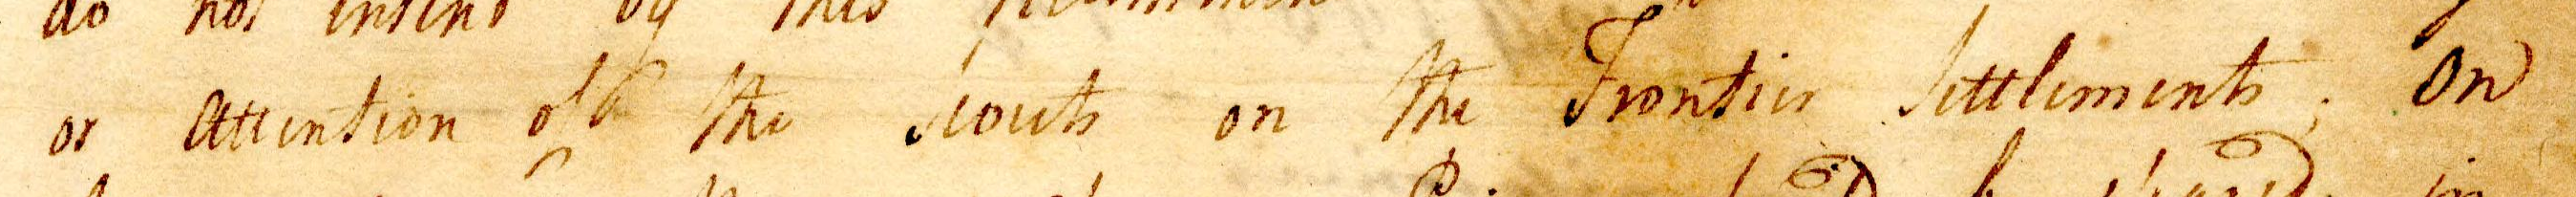or Attention of the scouts on the Frontier Settlements. On
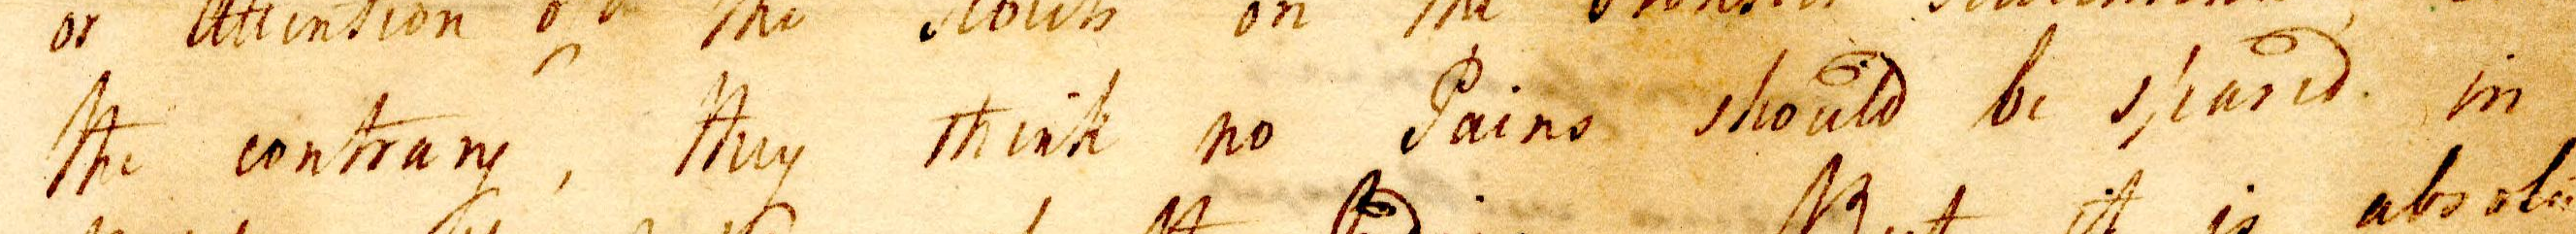the contrary, they think no Pains should be spared in
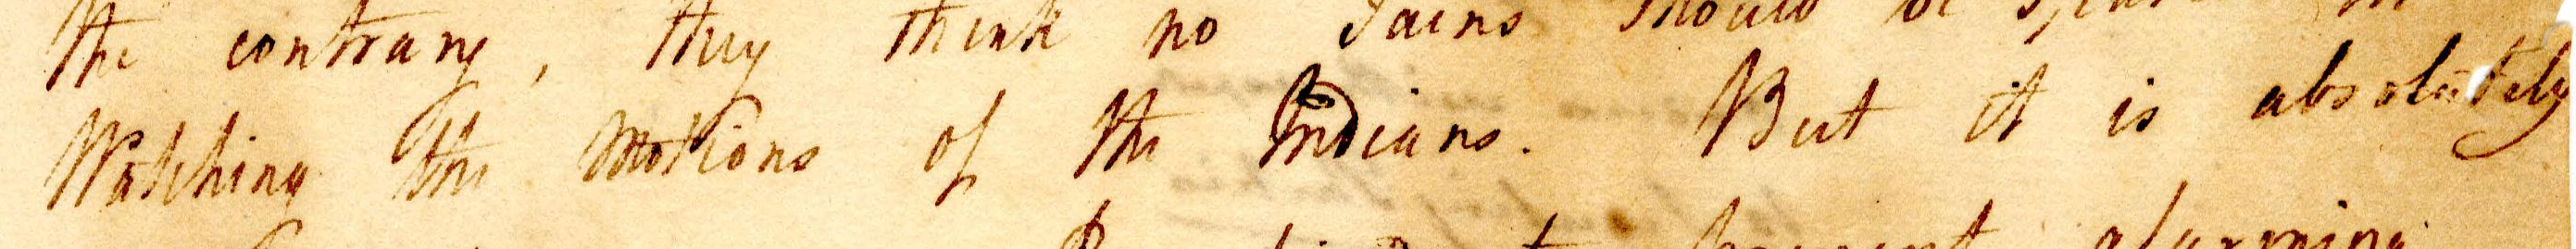Watching The Motions of the Indians. But it is absolutely
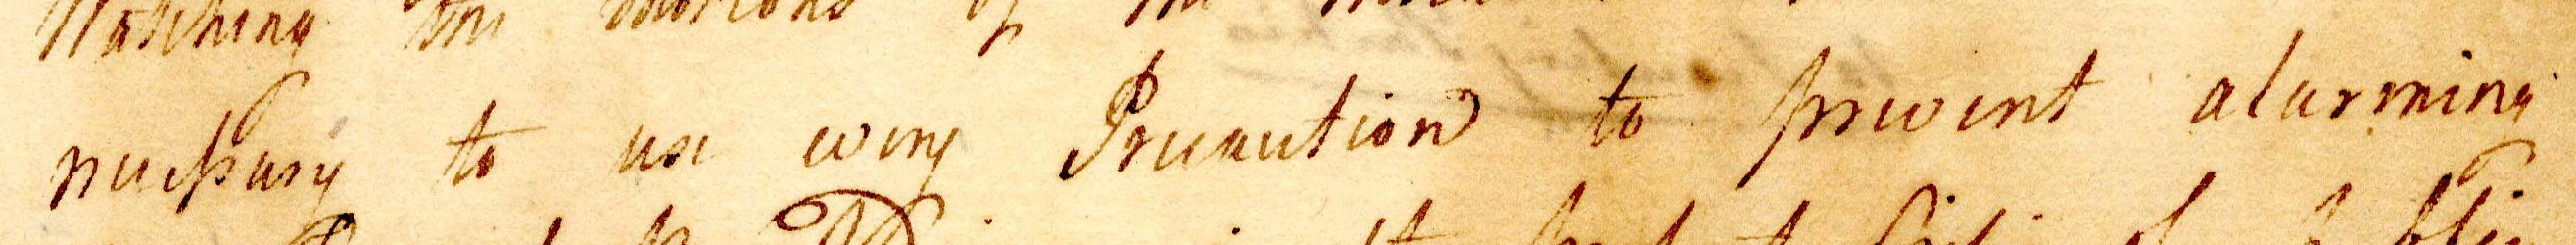necessary to use every Precaution to prevent alarming
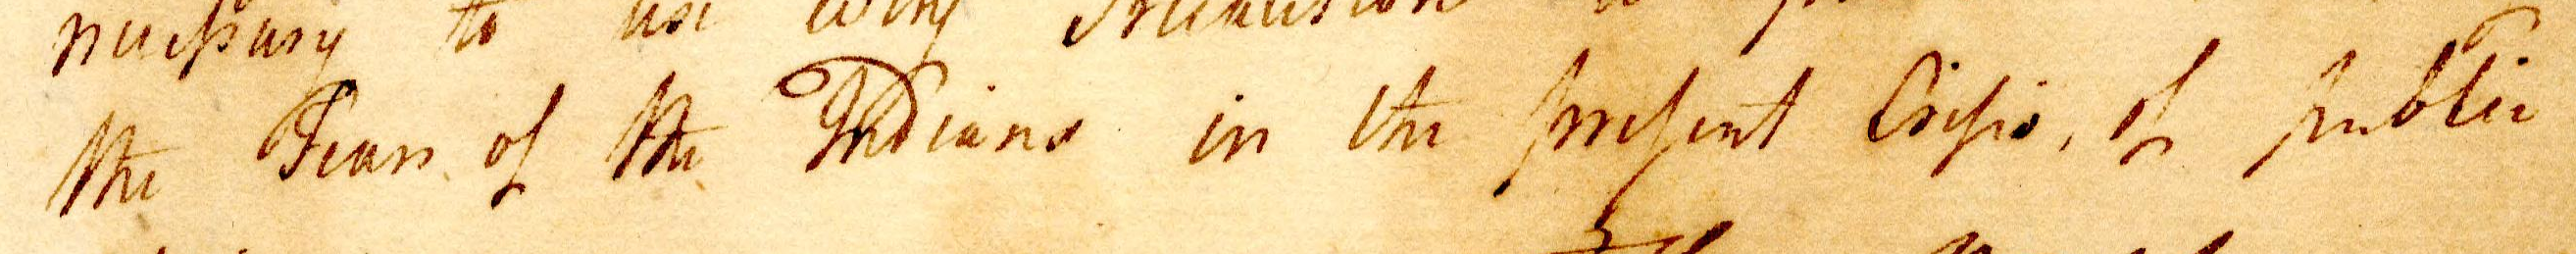the Fear of the Indians in the present Crisis of public
